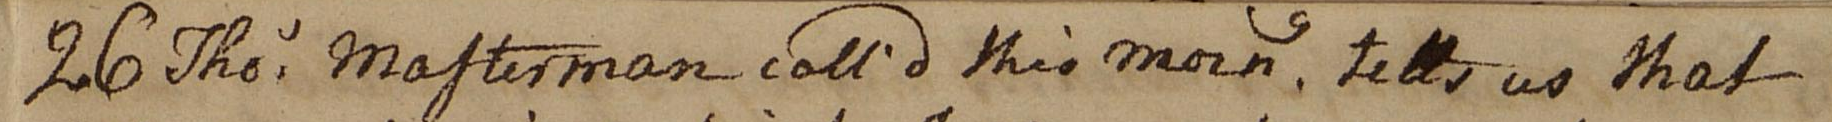26 Tho^s. Masterman call'd this morn^g. tells us that
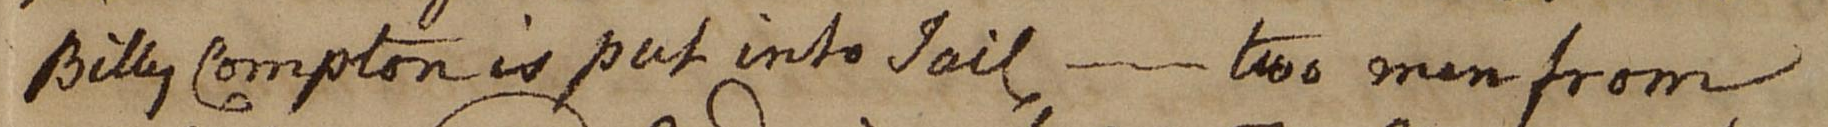Billy Compton is put into Jail- two men from
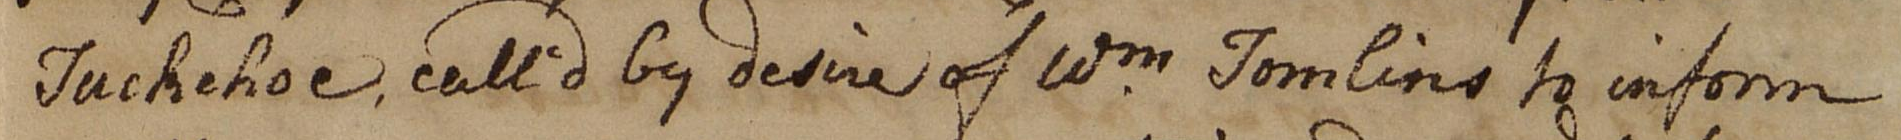Tuckehoe, call'd by desire of W^m. Tomlins to inform
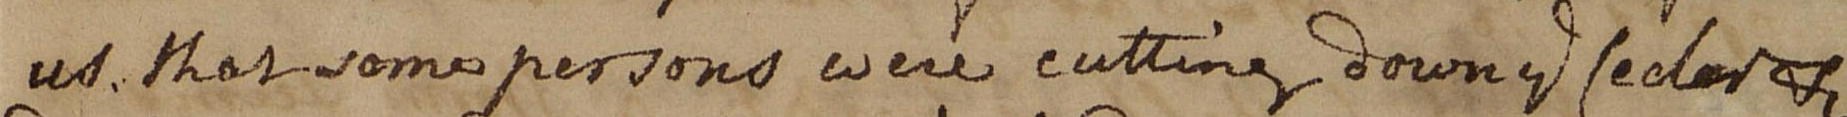us that some persons were cutting down y^e Cedar &c
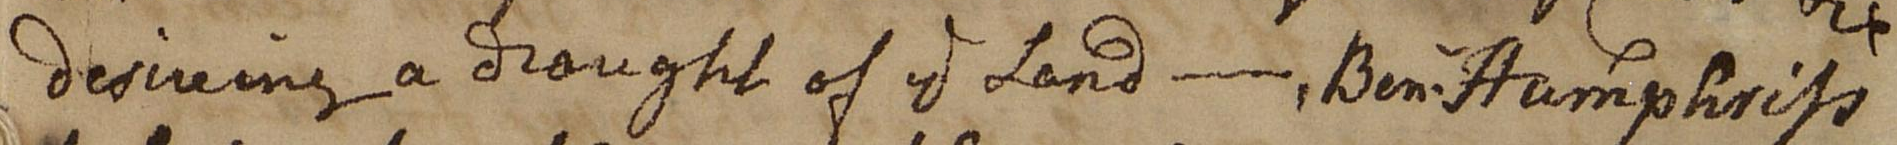desireing a drought of y^e Land-, Ben^n. Humphriss
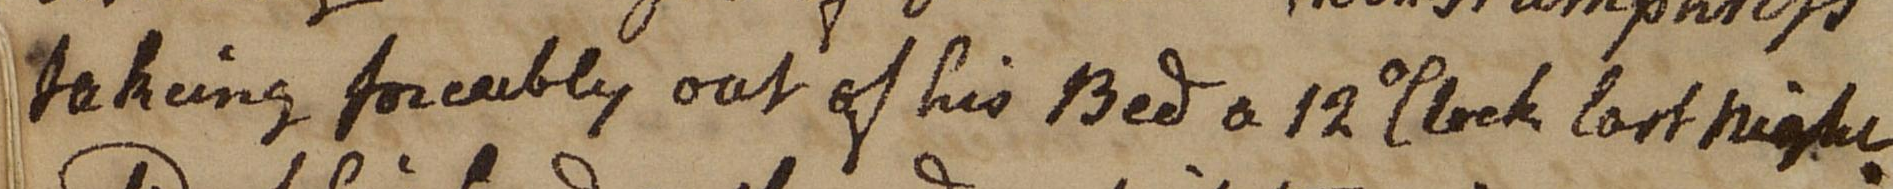takeing forcably out of his Bed a 12 ^oClock last night
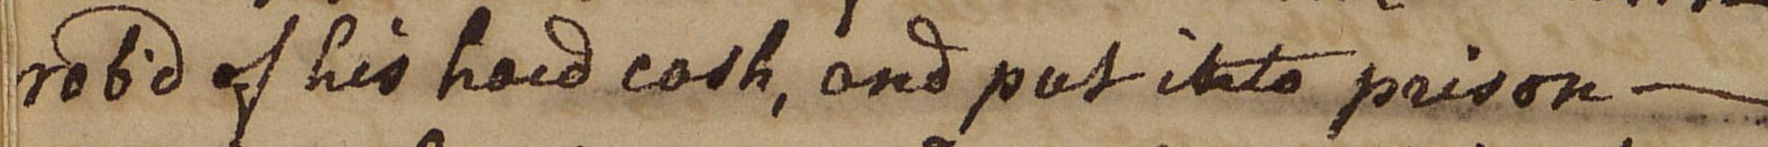rob'd of his hard cash, and put into prison-
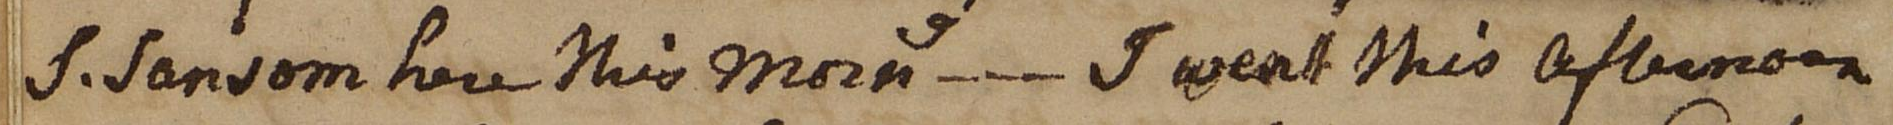S. Sansom here this morn^g-- I went this afternoon
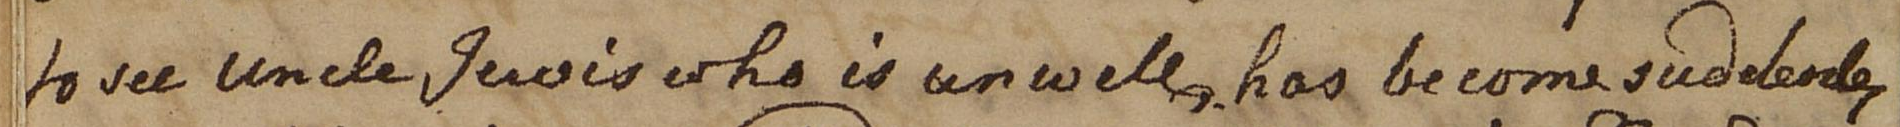to see Uncle Jervis who is unwell, has become suddenly
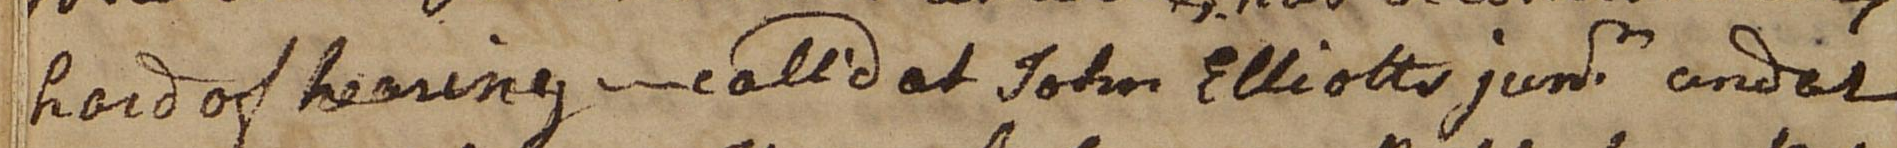hard of hearing- call'd at John Elliotts jun^r. and as
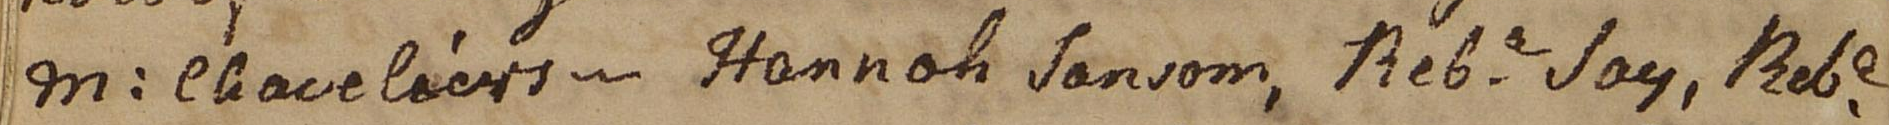M: Chaveliers- Hannah Sansom, Reb^a. Say, Reb^a.
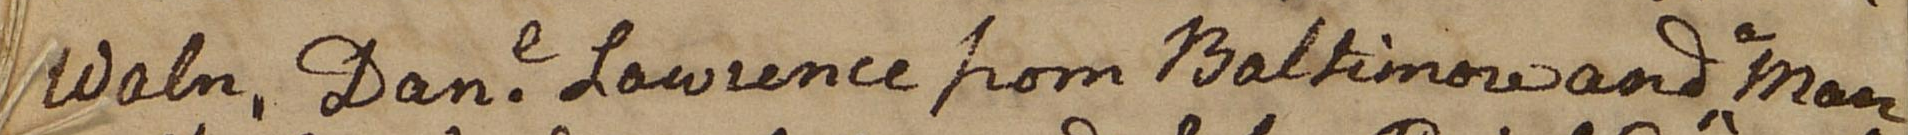Waln, Dan^l. Lawrence from Baltimore and ^a Man
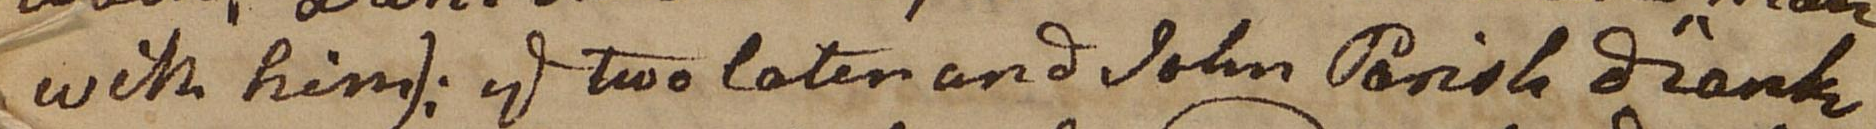with him): y^e two later and John Parish drank\
